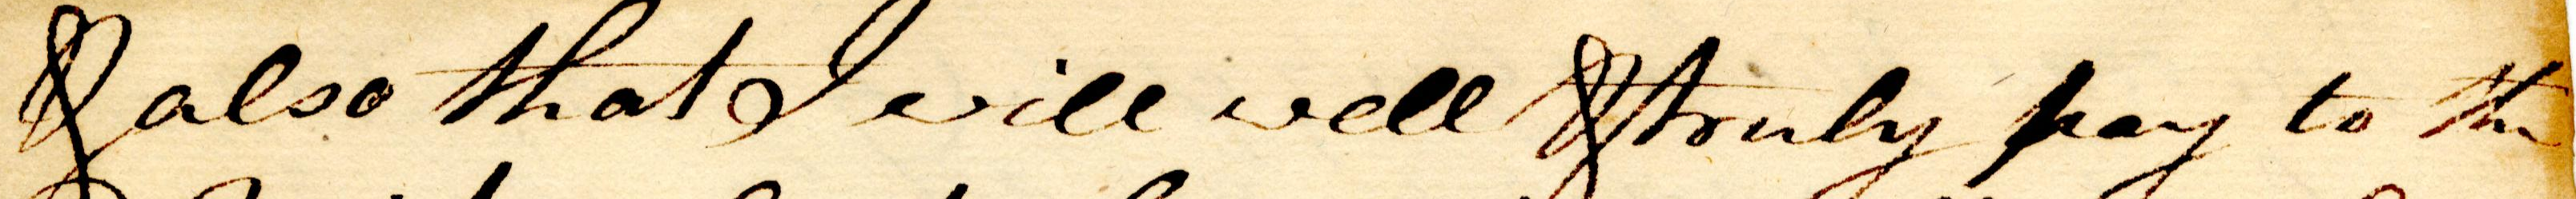& also that I will well & truly pay to the
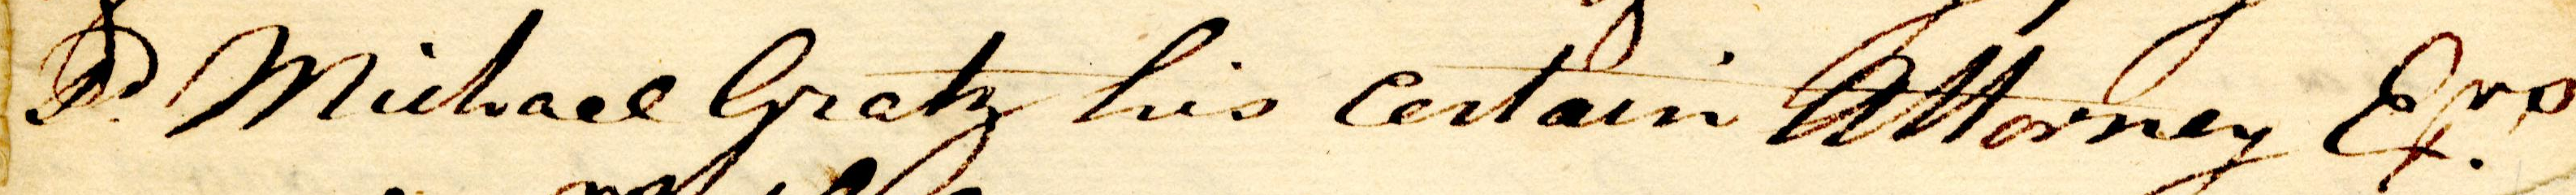s^d. Michael Gratz his certain Attorney Ex^rs.
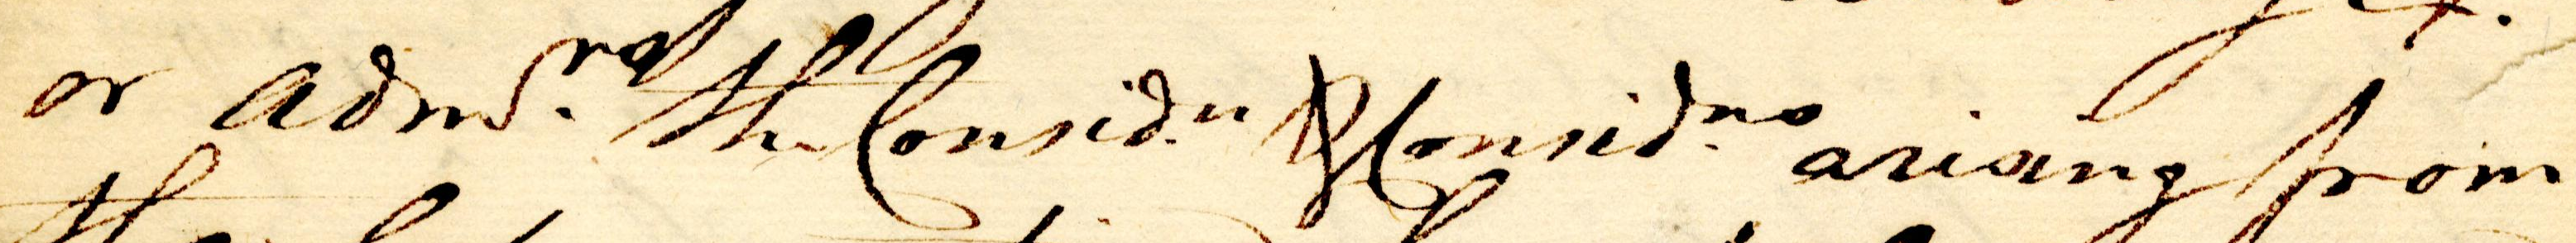or Adm^rs. the Consid^n & Consid^ns arising from
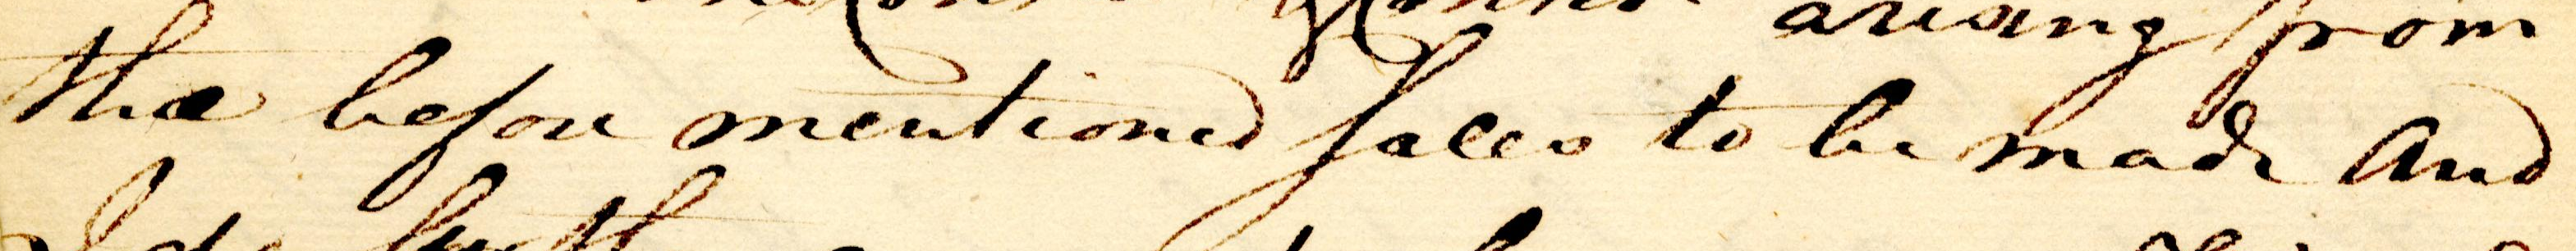the before mentioned sales to be made and
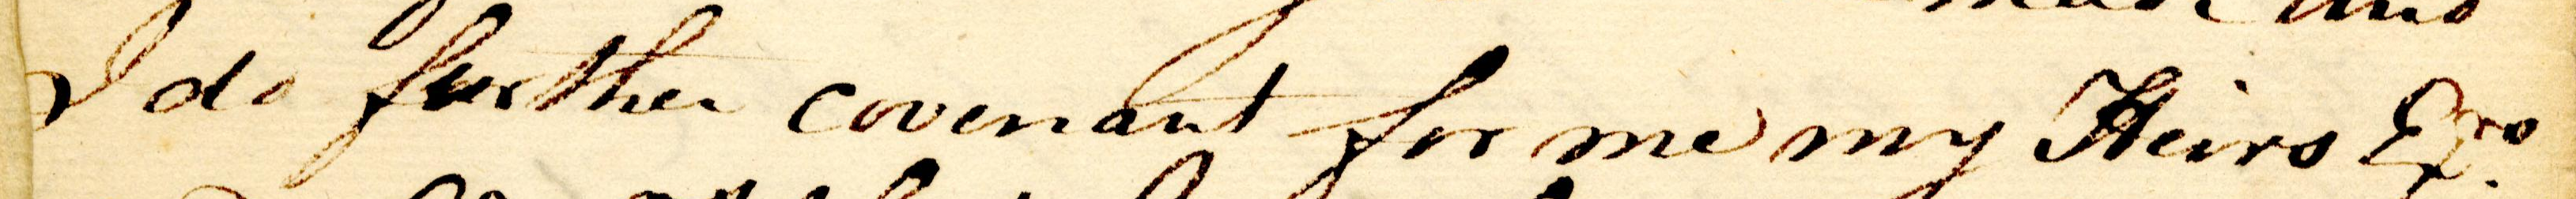I do further covenant for me my Heirs Ex^rs.
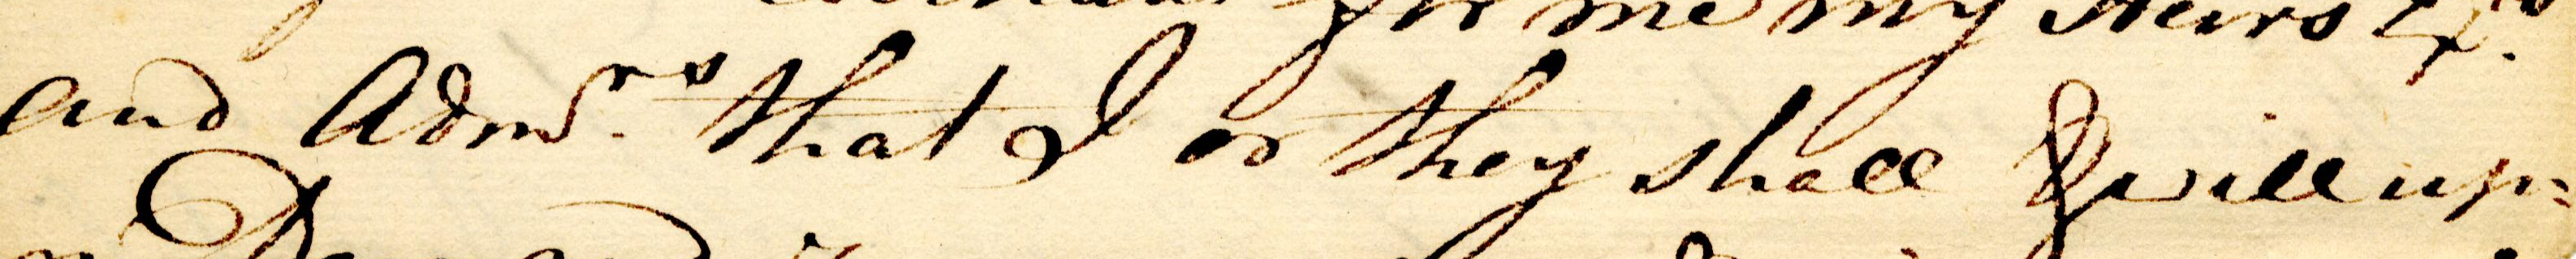and Adm^rs. that I so they shall & will up
